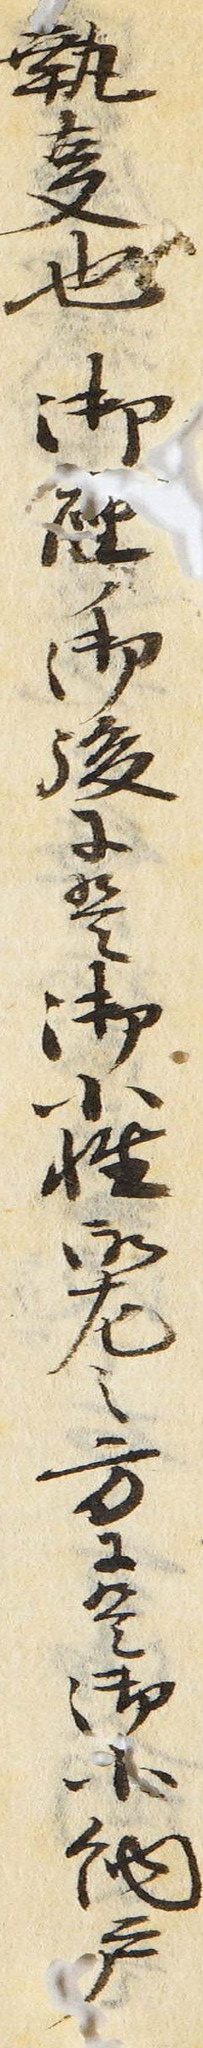執事也御座の御後には御小性御左之方には御小納戸
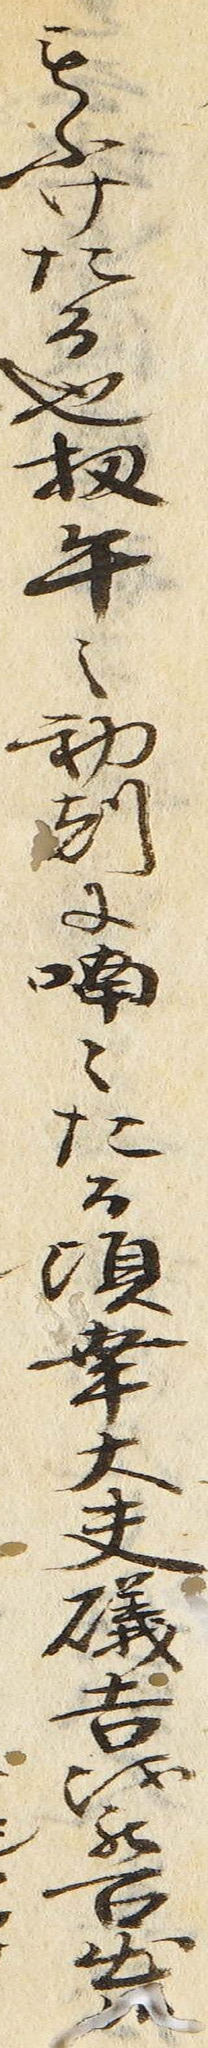もふけたる也扨午之初刻に喃々たる頃幸太夫磯吉を被召出候
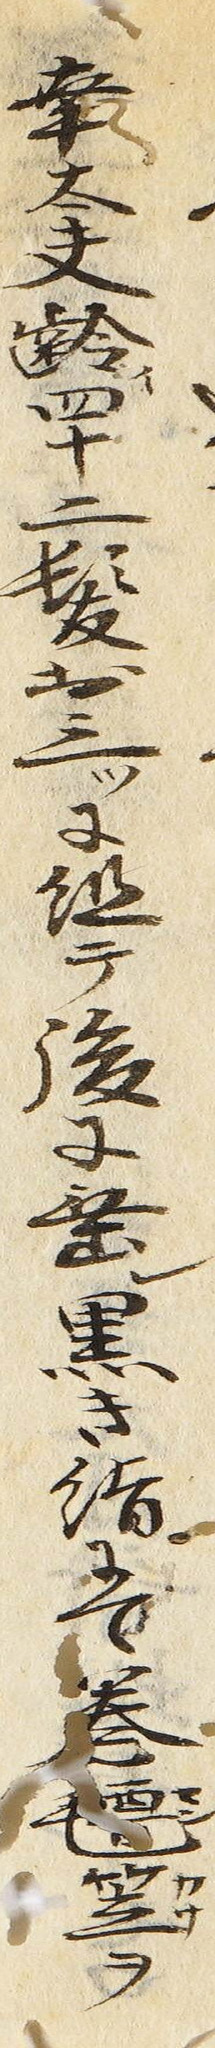幸太夫齢イ四十二髪お三ツに組て後に垂れ黒き絹にて巻氈笠を
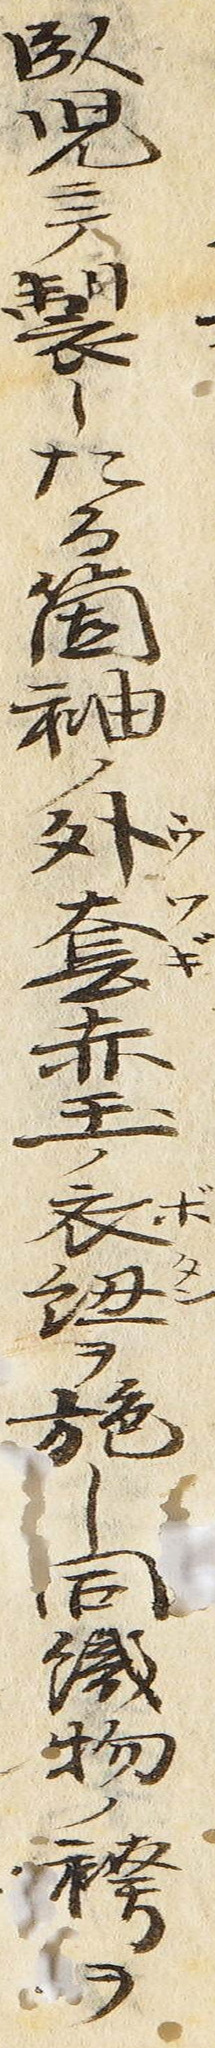臥児にて製したる筒袖の外套赤玉の衣紐を施し同織物の袴を
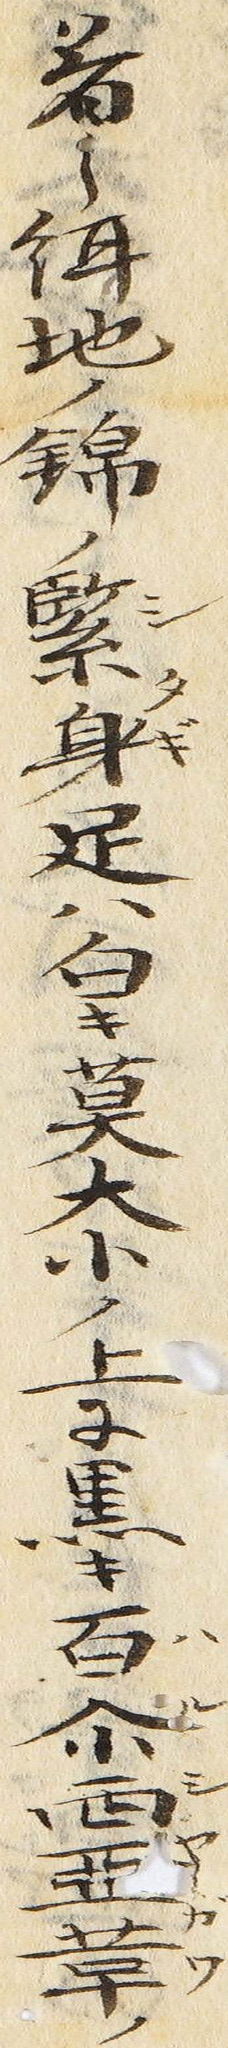着し紺地の錦の緊身足は白き莫大小の上に黒き百尒西亜革の
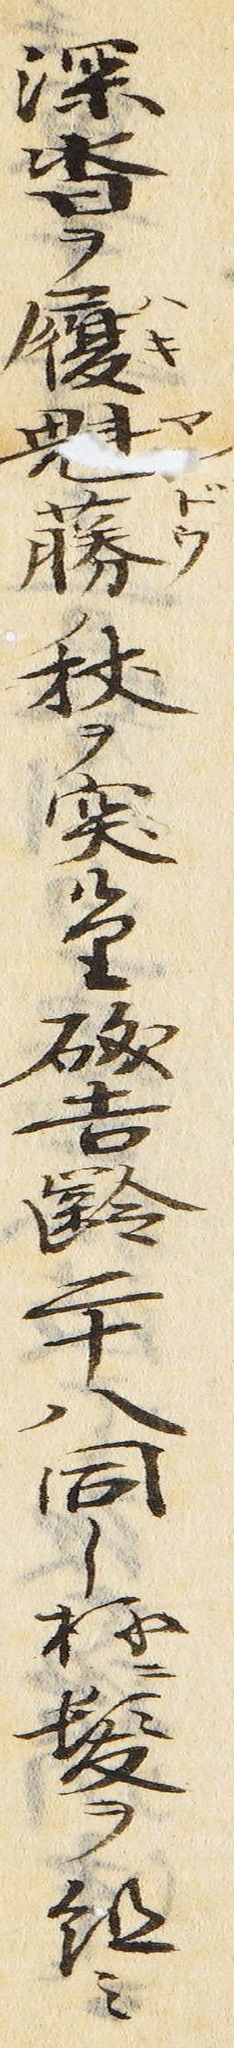深沓を履魁藤の杖を突けり磯吉齢二十八同し様に髪を組み
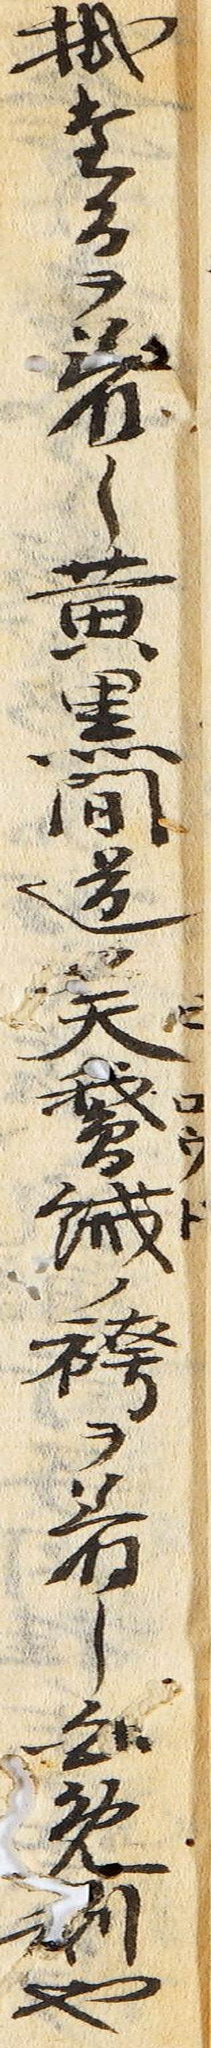掛たるを着し黄黒間道の天鵞絨の袴を着し白めりや
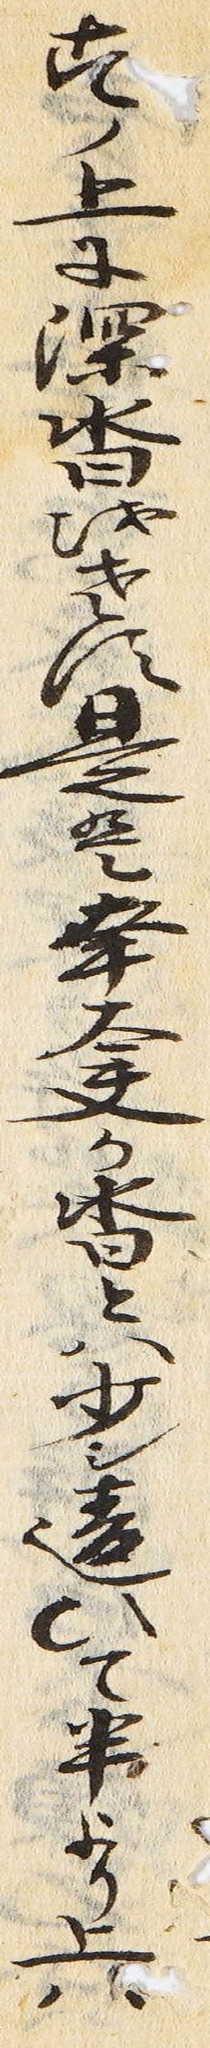すの上に深沓をさす是は幸太夫か沓とは少し違ひて半より上は
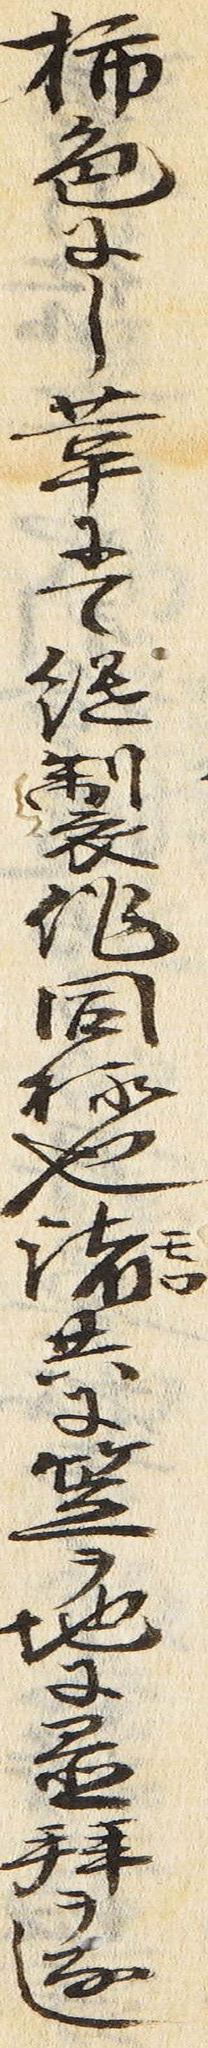柿色にし革にて縫製作同様也諸共に笠を地に置拝をなし
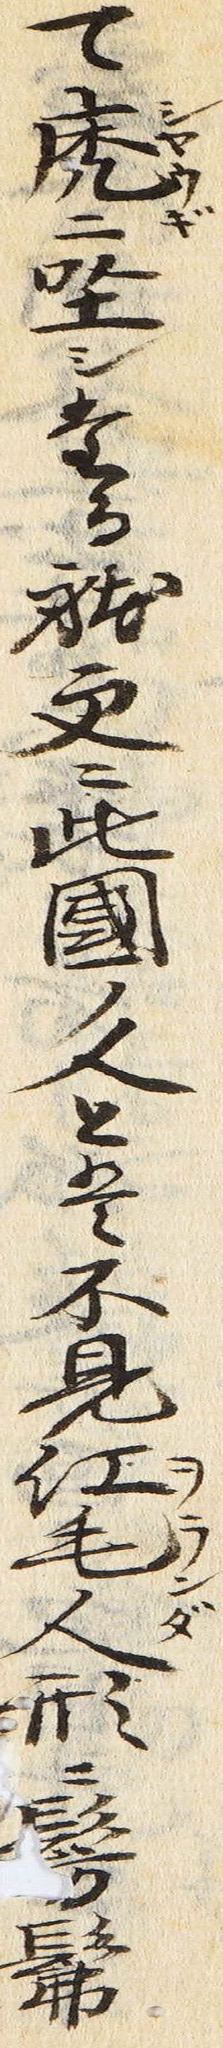て床几に坐したる体更に此国の人とは不見紅毛人形に髣髴
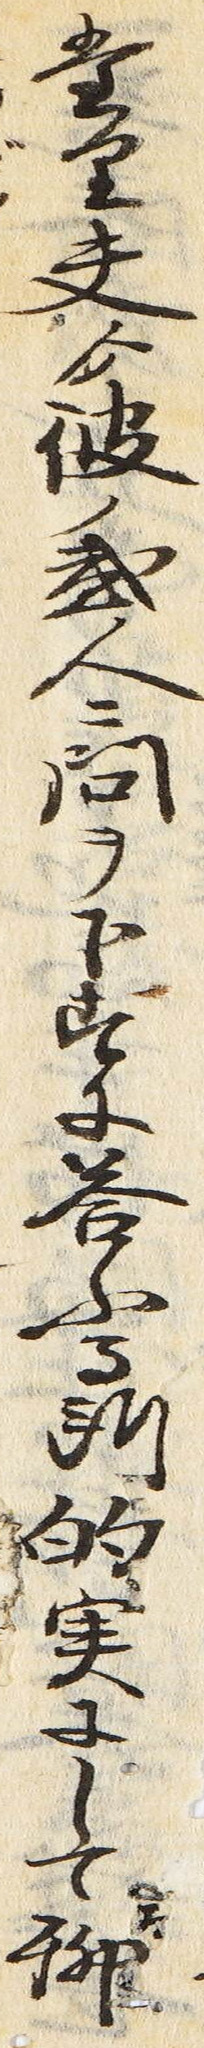たり夫ゟ彼の弐人に問を下すに答ふる所的実にして聊
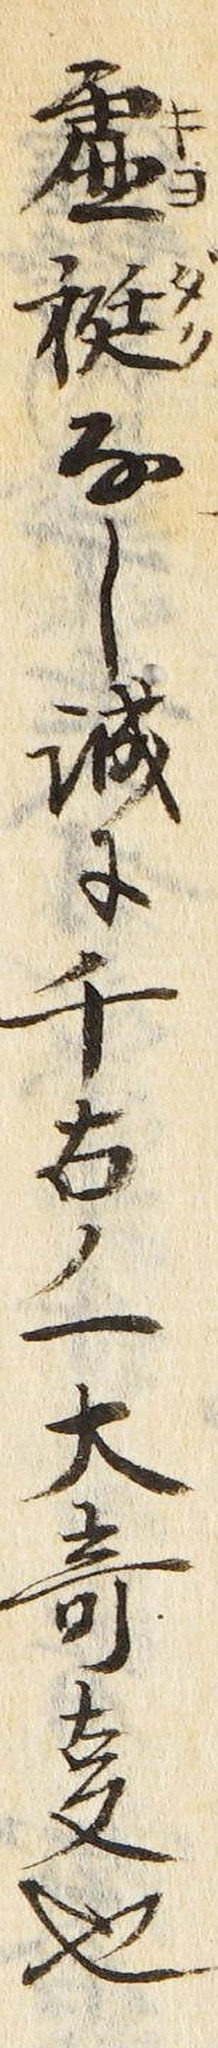虚䅍なし誠に千古の一大奇事也
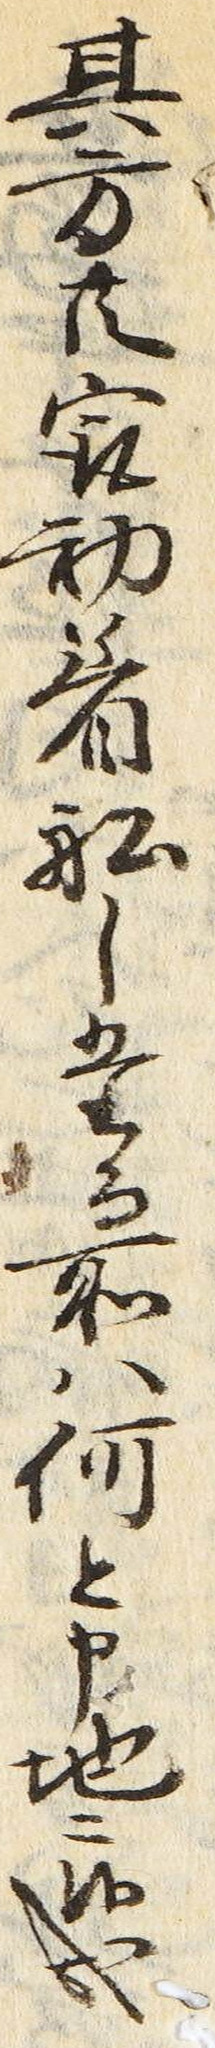其方共最初着船したる所は何と申地に候哉
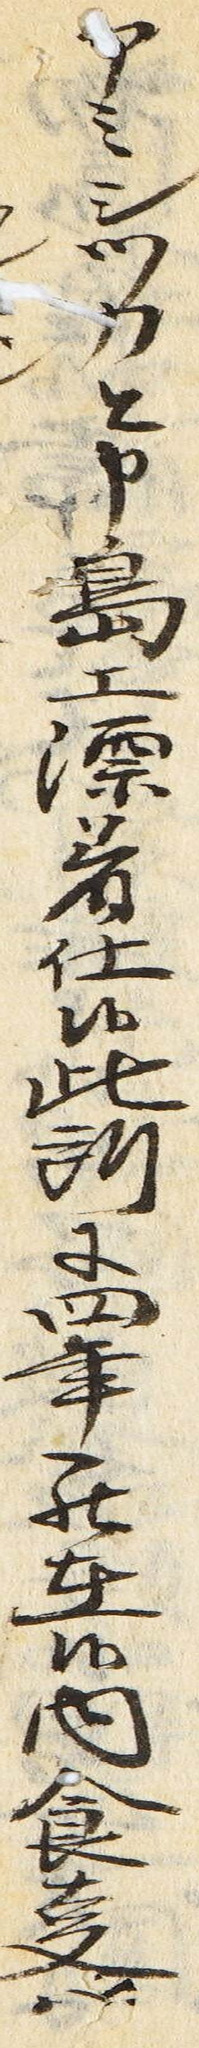アミシツカと申島え漂着仕候此所に四年罷在候内食事は
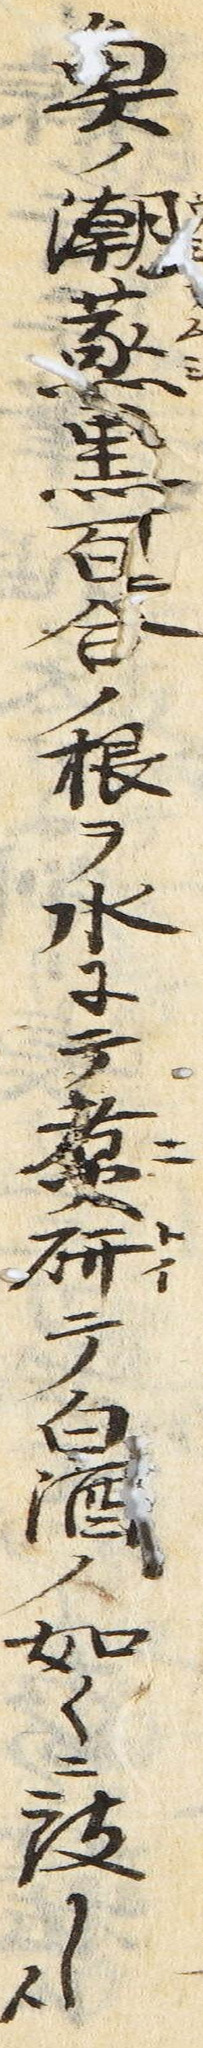魚の潮蒸黒百合の根を水にて煮研て白酒の如くに致し候
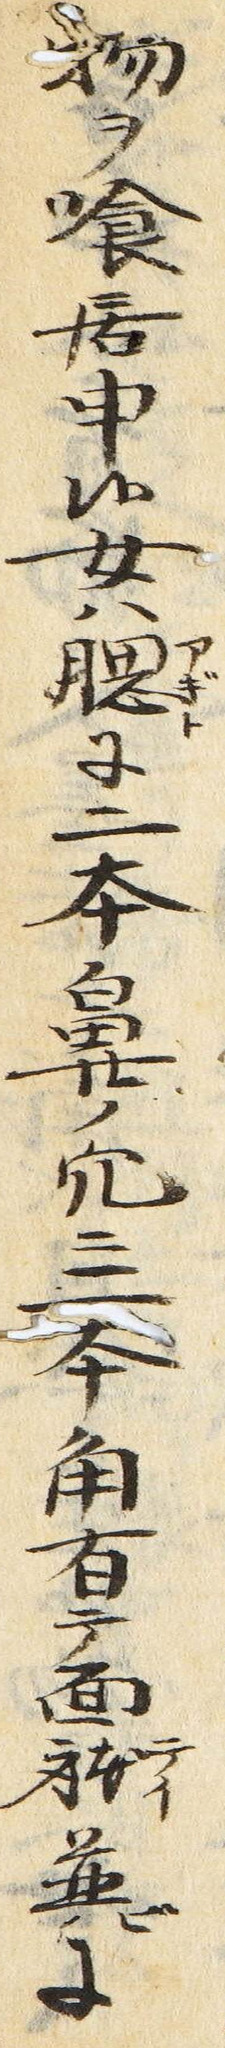物を喰居申候女は腮に二本鼻の穴に二本角有て面体並びに
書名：神昌丸漂流問答
